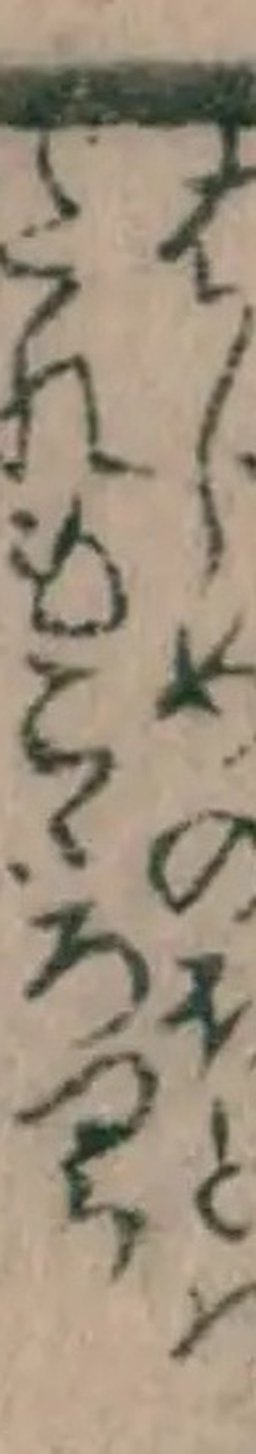たれもこゝろつか
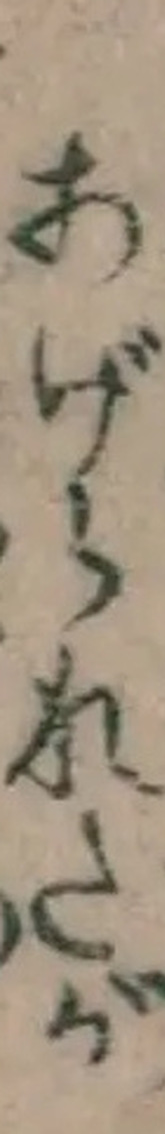あげられたが
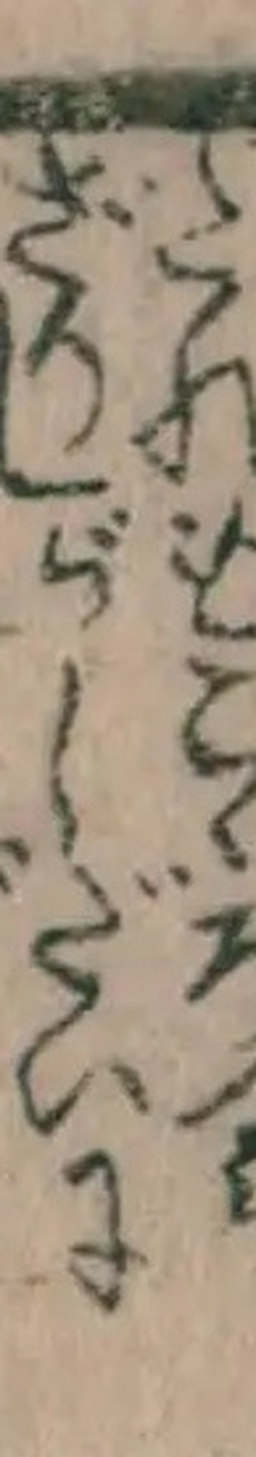ざりしがしだいに
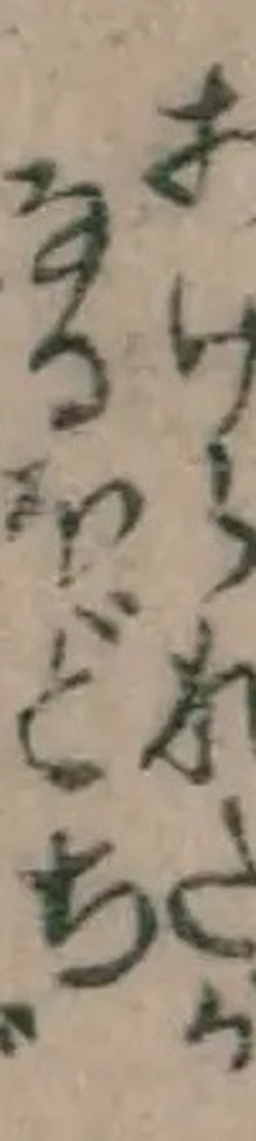なるほどち
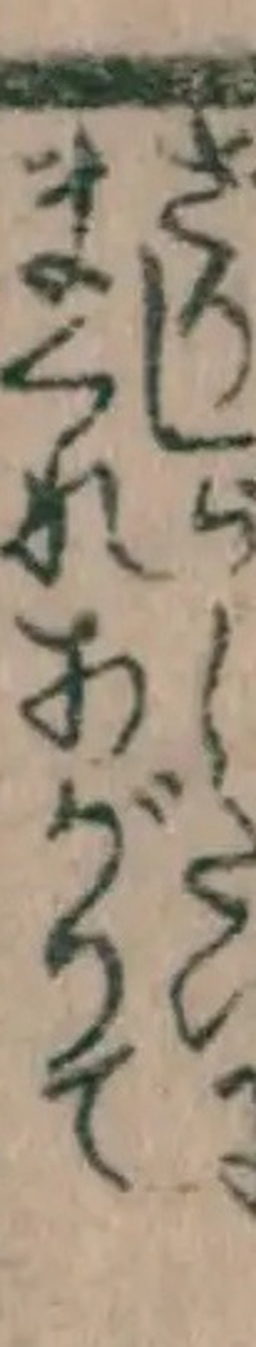まくれあがりて
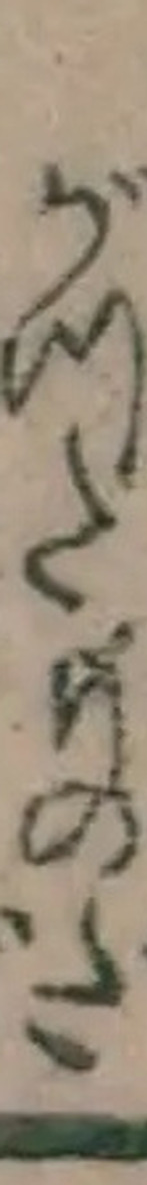がつたものだ
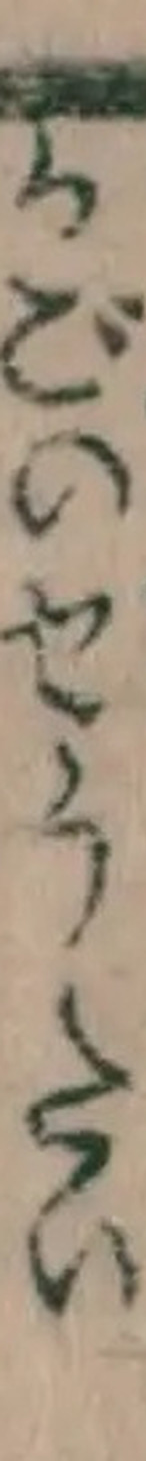かごのせうたい
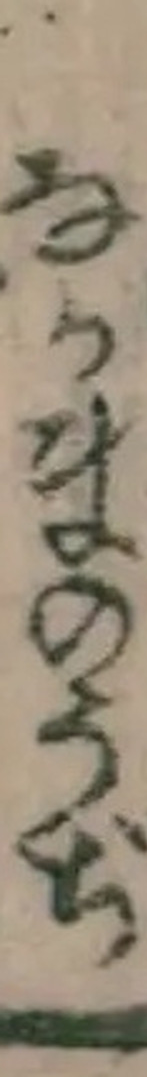なかまのうぢ
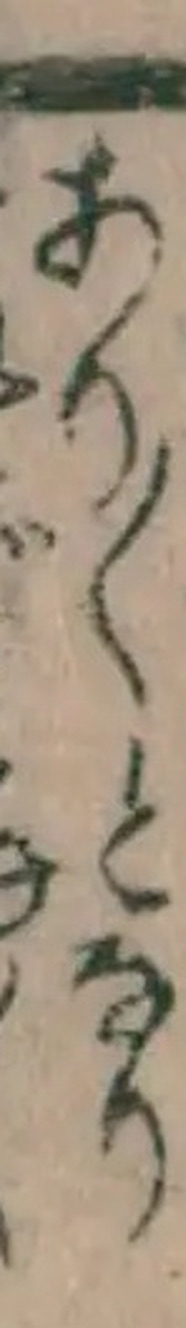あり〳〵となり
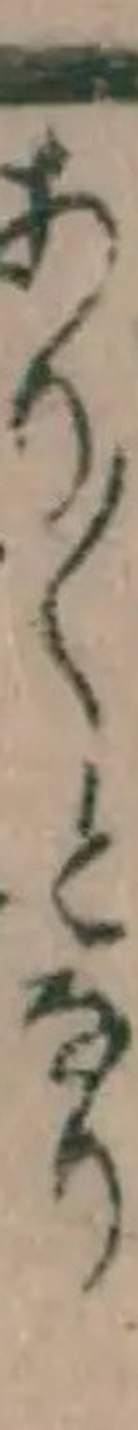あり〳〵となり
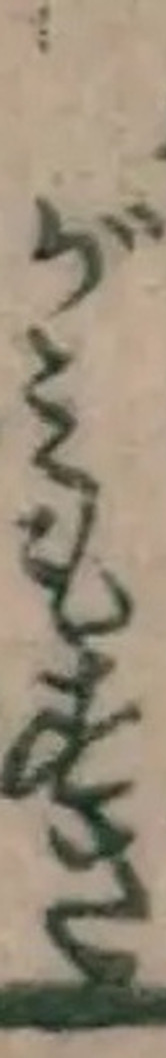がみもすさ
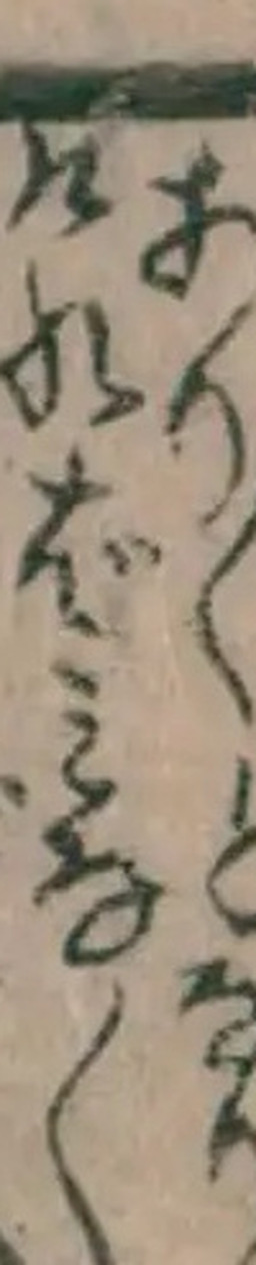ければみな〳〵
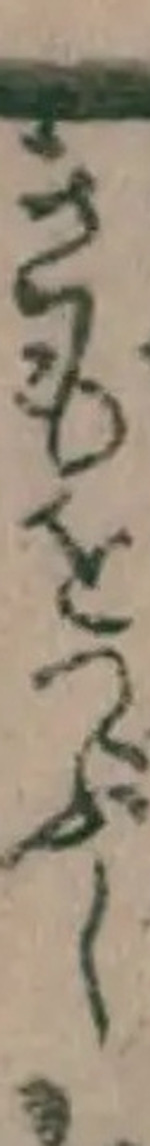きもをつぶし
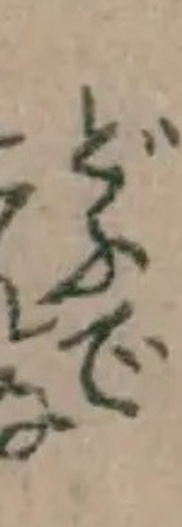どふで
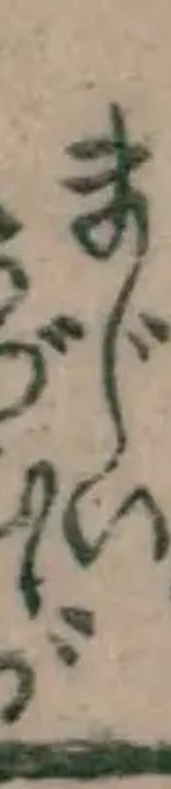まぢい
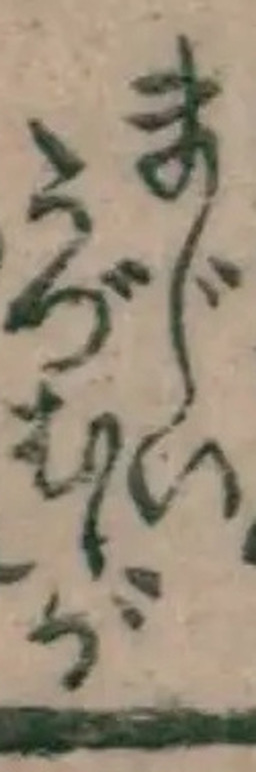うづむしが
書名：信有奇怪会
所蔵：国立国会図書館 National Diet Library, JAPAN
